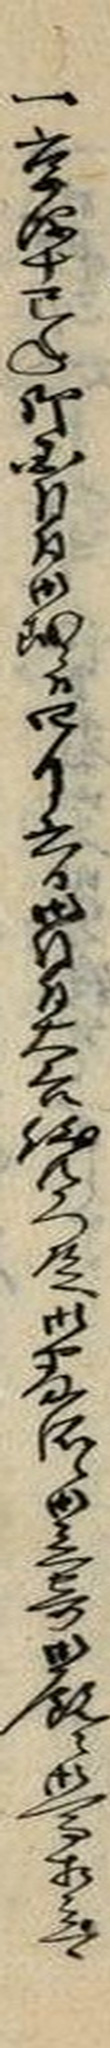一享保十己年御国目付御越に付四月六日御目付大谷儀左衛門殿御番所へ御立寄御厩に御馬相立可
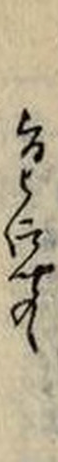旨被仰聞候
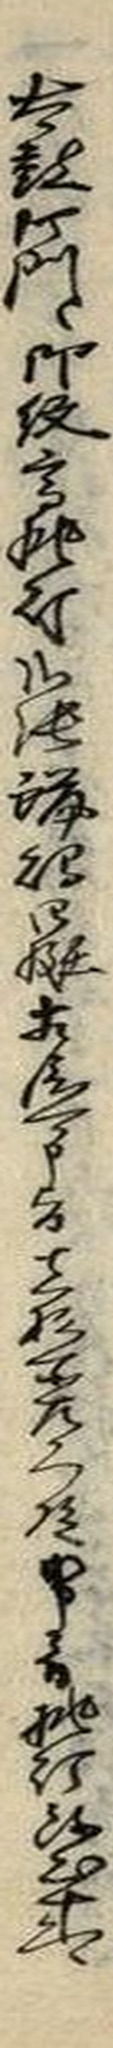太鼓御門へ御紋高提灯弐張蝋燭四挺相渡可申旨真杉所左衛門殿御申に付提灯致出来候
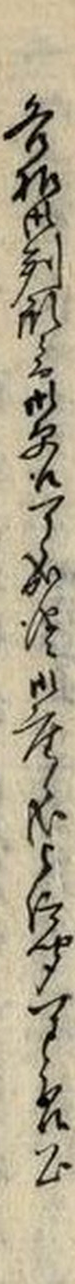各様御判形に而御受取可被成候儀に御座候哉被仰聞可被下候以上
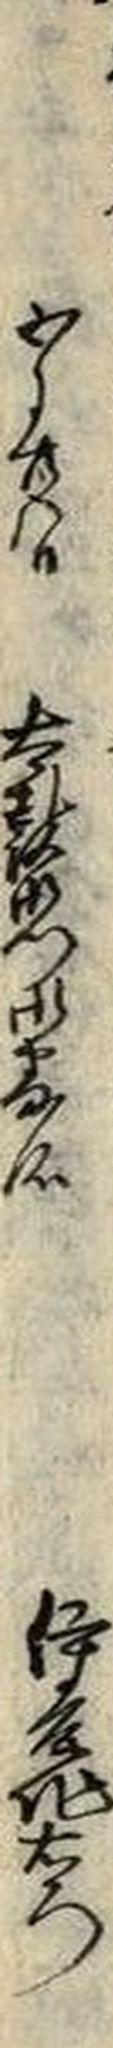五月廿八日太鼓御門御番所伊藤作右衛門
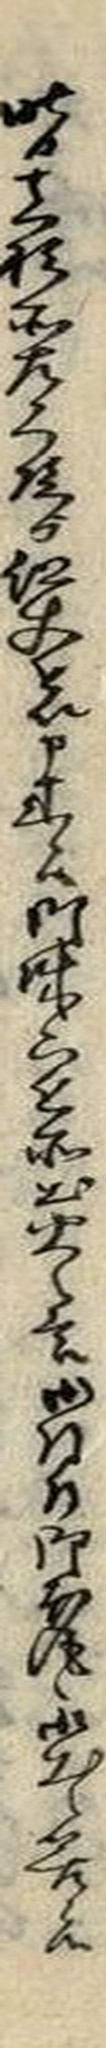昨日真杉所左衛門殿より組使を以申来候は御城下近所出火之節御目付御本丸へ御出候筈に候
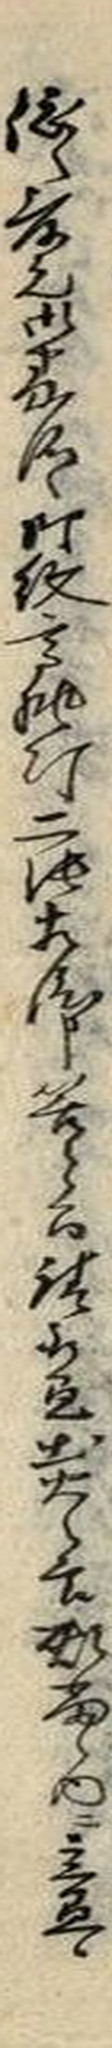依之爰之御番所へ御紋高提灯二張相渡申筈に候間請取置出火之節燭当之内に立置候
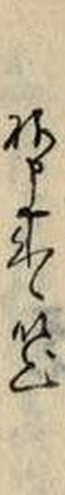様申来候以上
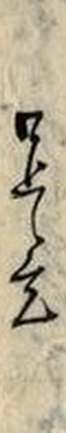口上之覚
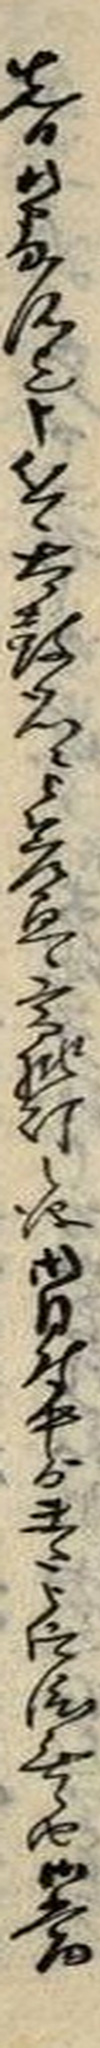先日御番所迄申進候太鼓御紋に被差置候高提灯之儀御目付中ゟ未た被仰渡無之由御当
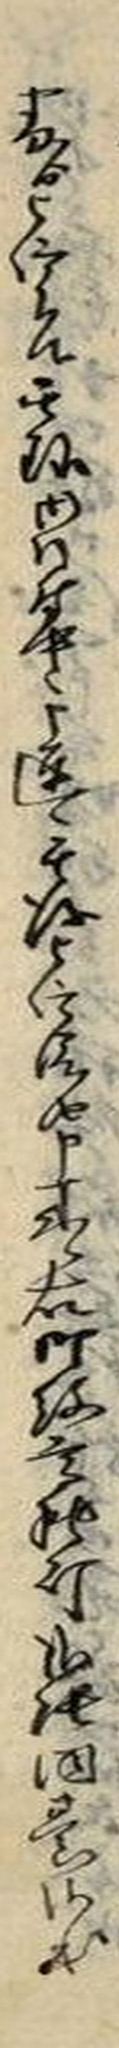番ゟ被仰下候其趣御目付中へ申達候其後被仰渡候由申来候右御紋高提灯同台弐本

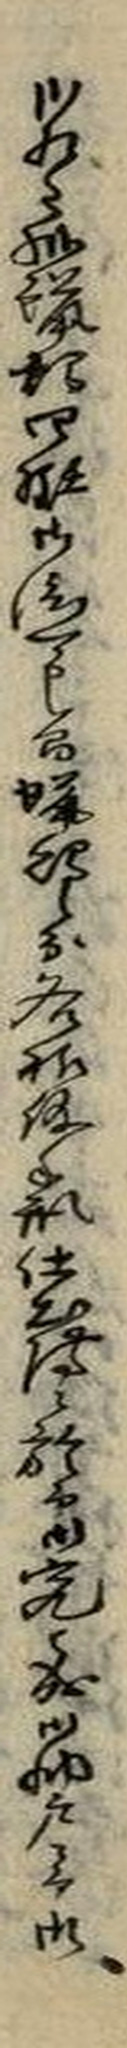弐拾匁掛蝋燭四挺御渡可申候間蝋燭之分各様仮手形仕出場に於而御究被成御納戸に而御
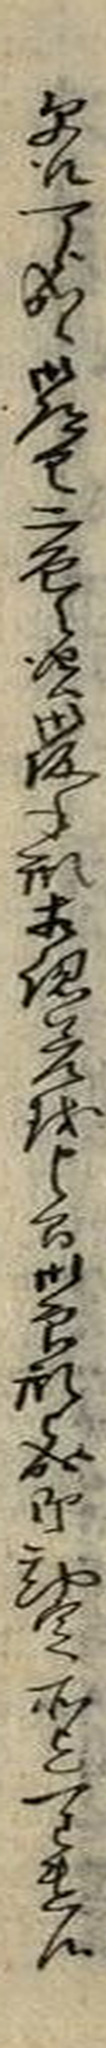受取可被成候御道具二色之儀は御仮手形相認差越申候間御印形被成御勘定所迄可被遣候
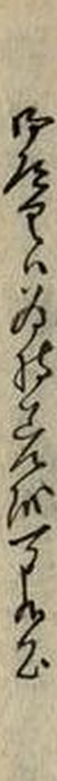御道具は為持差越可申候以上
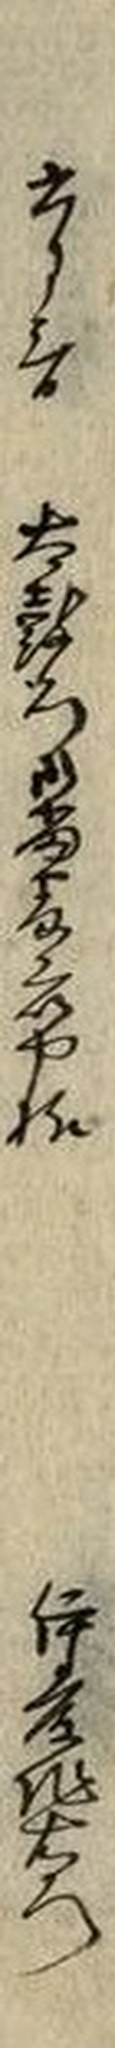六月三日太鼓御門御当番衆中様伊藤作右衛門
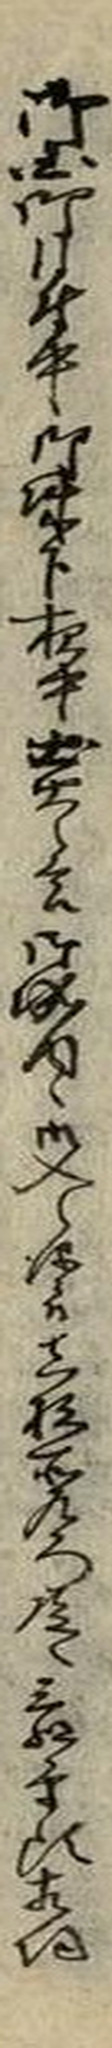御国目付中御城下夜中出火之節御城内へ御入候儀に付真杉所左衛門殿へ三組筆頭相伺
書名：御門御櫓之部
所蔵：福井県文書館 Fukui Prefectural Archives
